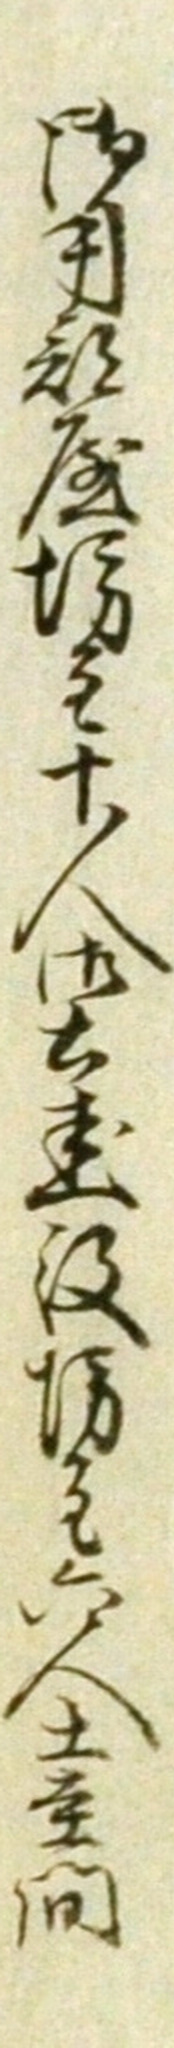御用部屋坊主十人御土圭役坊主六人土圭間
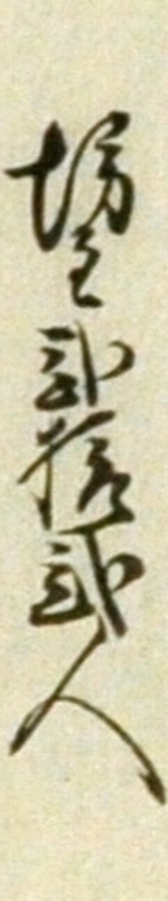坊主弐拾弐人
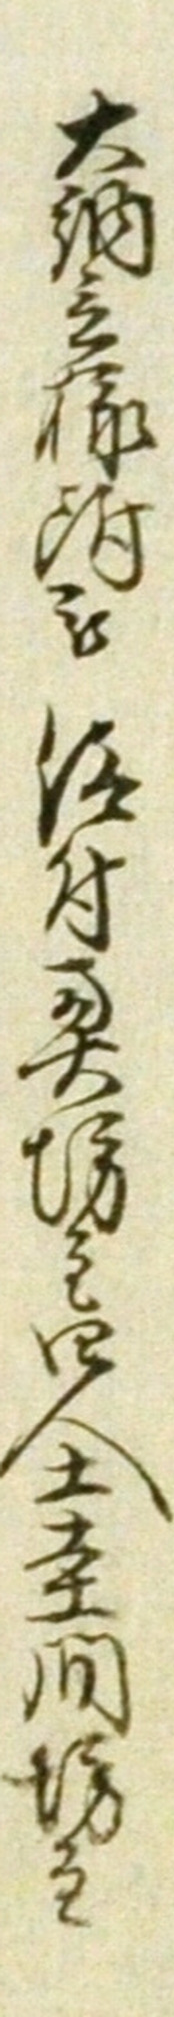大納言様附被仰付奥坊主四人土圭間坊主
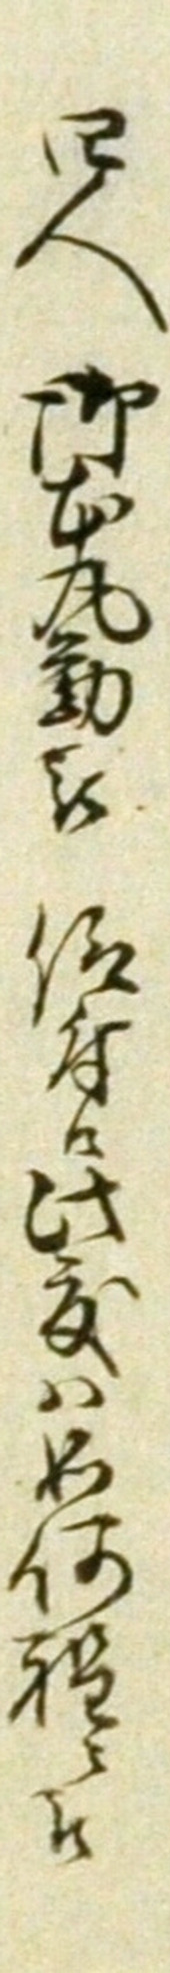四人御本丸勤被仰付候此度ハ如何程ニ被
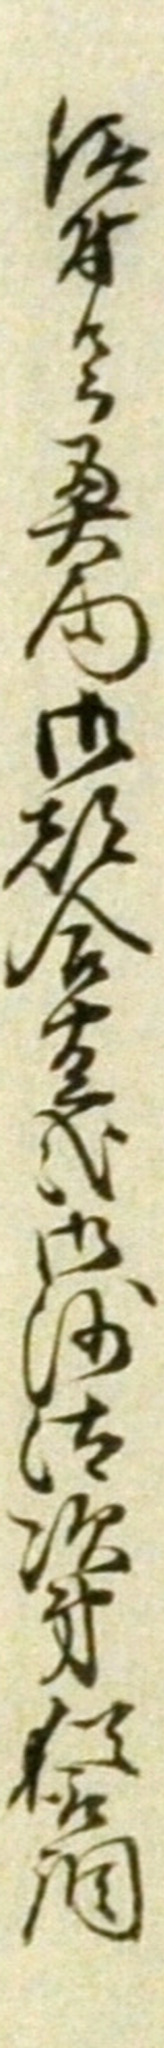仰付候而奥向御都合宜哉御沙汰次第猶取調
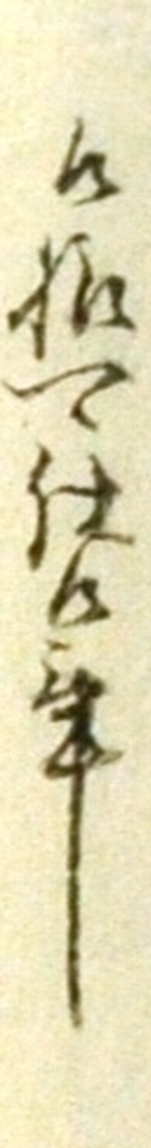候様可仕候事

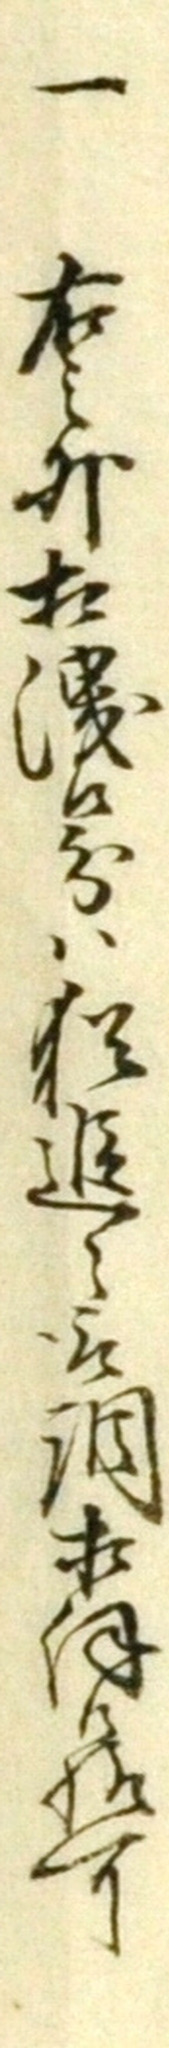一右之外相漏候分ハ猶追々取調相伺候様可
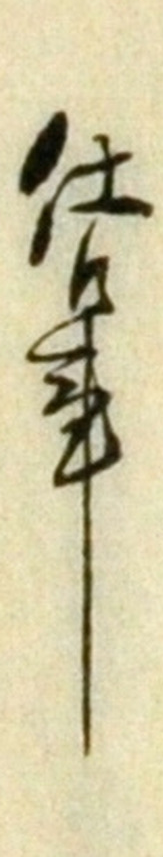仕候事
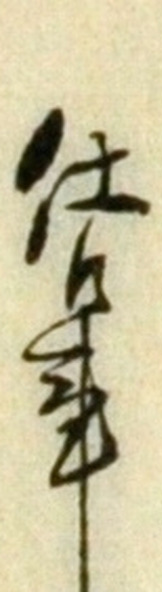仕候事

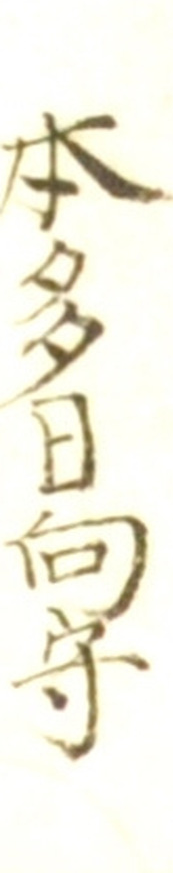本多日向守

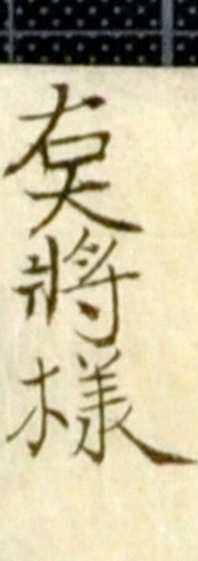右大将様

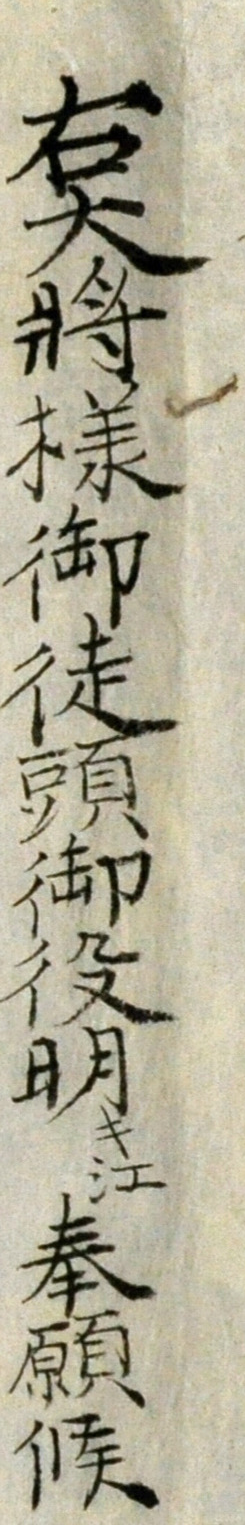右大将様御徒頭御役明キ江奉願候
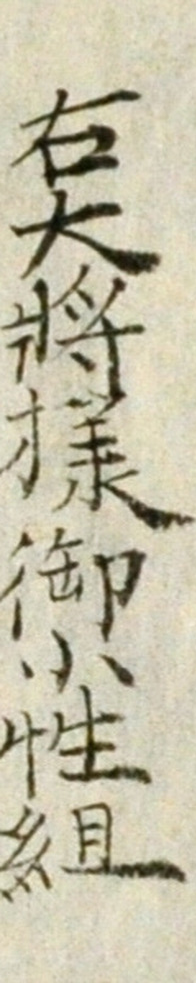右大将様御小姓組
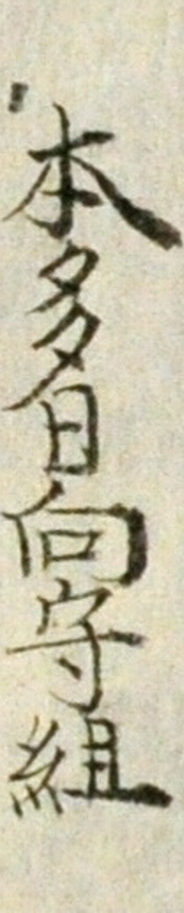本多日向守組
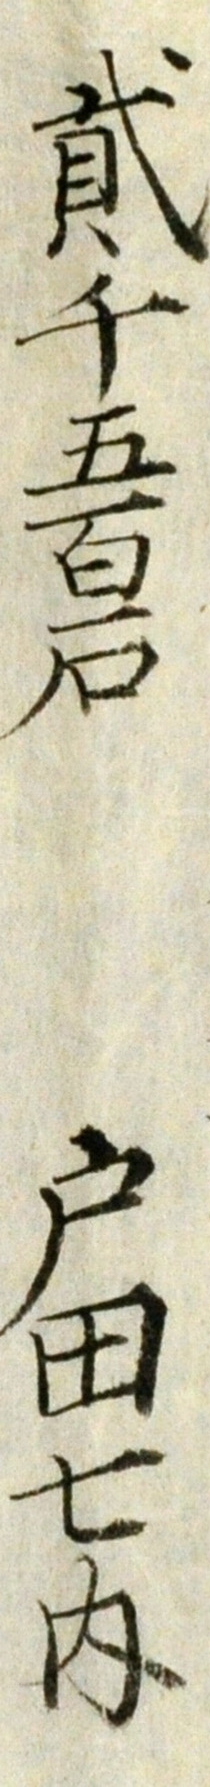弐千五百石戸田七内
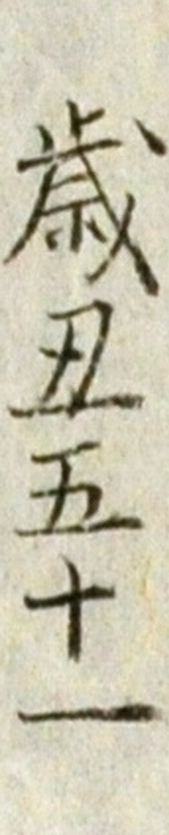歳丑五十一
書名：若年寄御役中御調書付
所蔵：伊那市立高遠町図書館・合同会社AMANE
